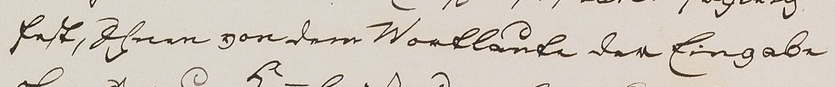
fest, Ihnen von dem Wortlaute der Eingabe
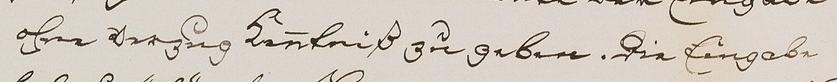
ohne Verzug Kenntniß zu geben. Die Eingabe
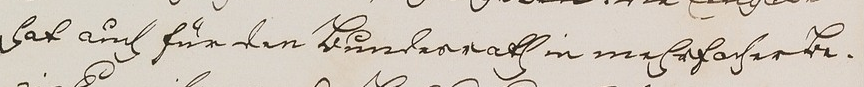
hat auch für den Bundesrath in mehrfacher Be-
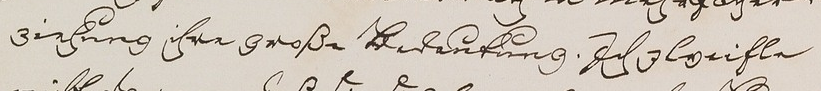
ziehung ihre große Bedeutung. Ich zweifle
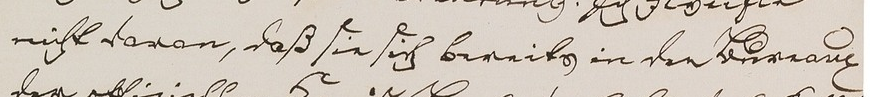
nicht daran, daß sie sich bereits in den Bureaux
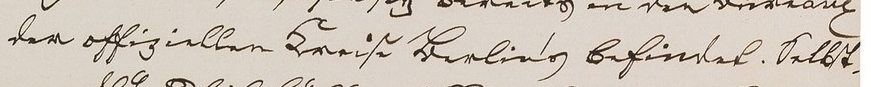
der offiziellen Kreise Berlin's befindet. Selbst-
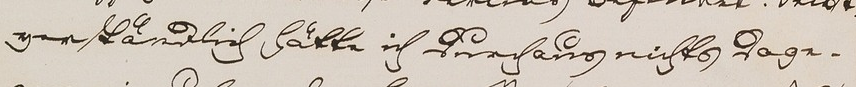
verständlich hätte ich durchaus nichts dage-
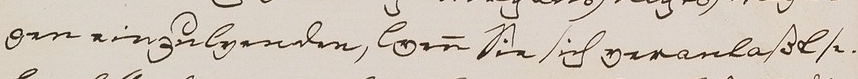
gen einzuwenden, wenn Sie sich veranlaßt se-
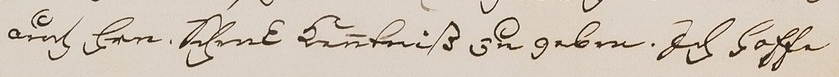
auch Hrn. Schenk Kenntniß zu geben. Ich hoffe
